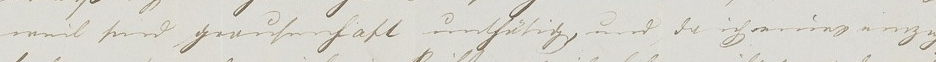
weil sind grausenhaft unthätig, und da ich eines einzigen
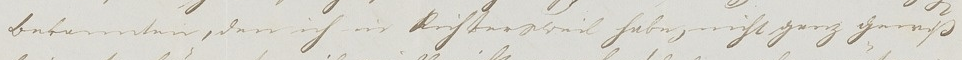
Bekannten, den ich in Richtersweil habe, nicht ganz gewiß
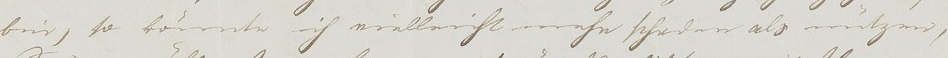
bin, so könnte ich vielleicht mehr schaden als nützen,
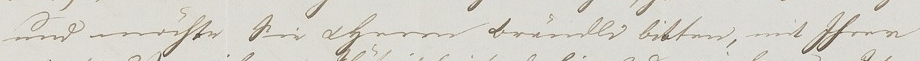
und möchte Sie & Herrn Brändli bitten, mit Ihrer
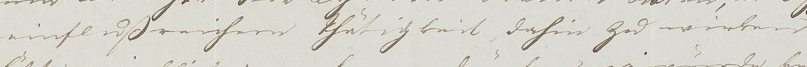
einflußreichern Thätigkeit dahin zu wirken.
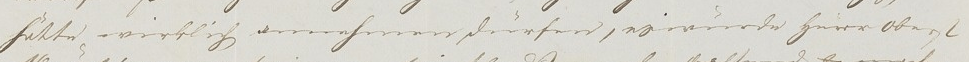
hätte wirklich annehmen dürfen, es würde Herr Oberst
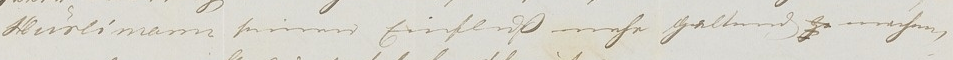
Hürlimann seinen Einfluß mehr geltend ge machen,
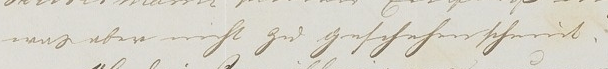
was aber nicht zu geschehen scheint.
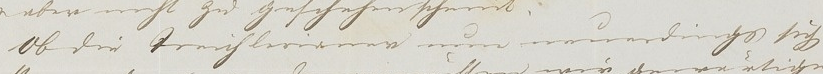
Ob die Treichlerianer nun neuerdings sich
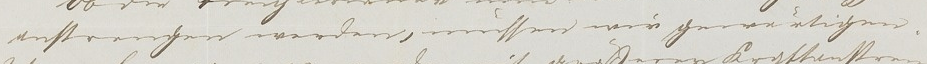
anstrengen werden, müssen wir gewärtigen.
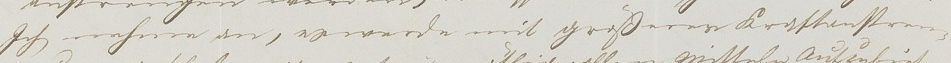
Ich nehme an, es werde mit größerer Kraftanstren-
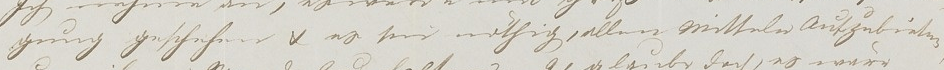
gung geschehen & es sei nöthig, allen Mitteln aufzubieten,
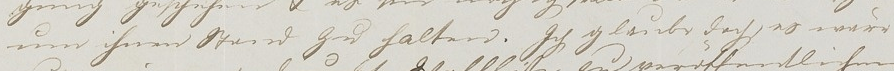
um ihnen Stand zu halten. Ich glaube doch, es wäre
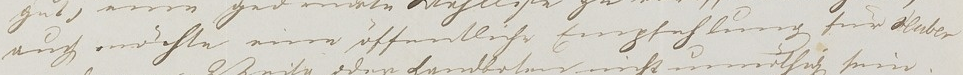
auch möchte eine öffentliche Empfehlung für Huber
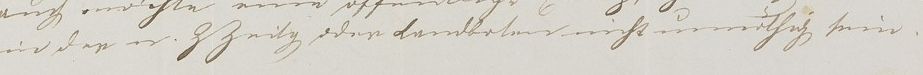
in der n. ZZeitg oder Landboten nicht unnöthig sein.
